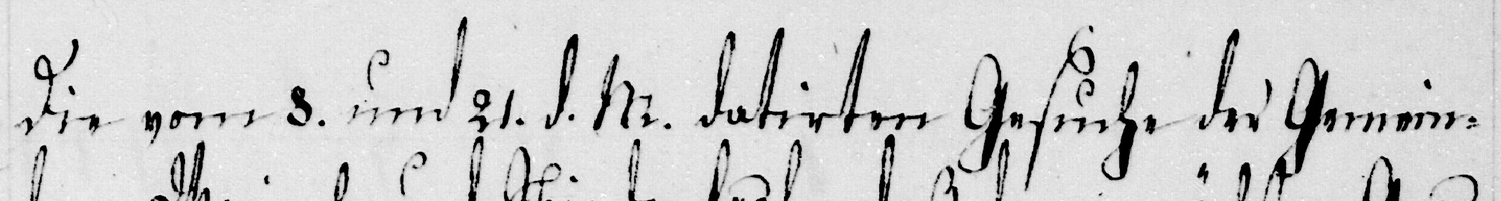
Die vom 8. und 21. d. M. datirten Gesuche der Gemein¬
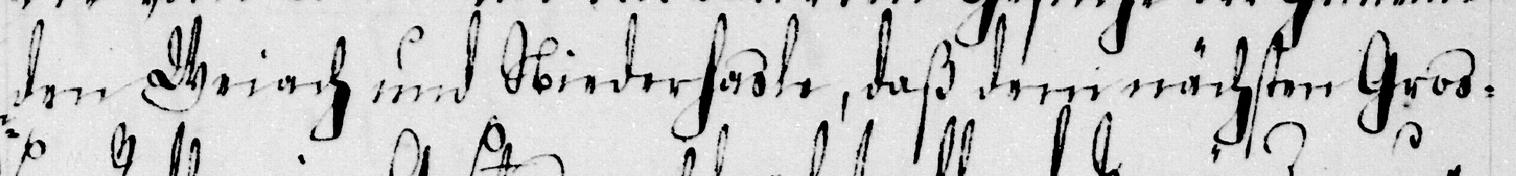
den Weiach und Niederhasle, daß dem nächsten Groß¬
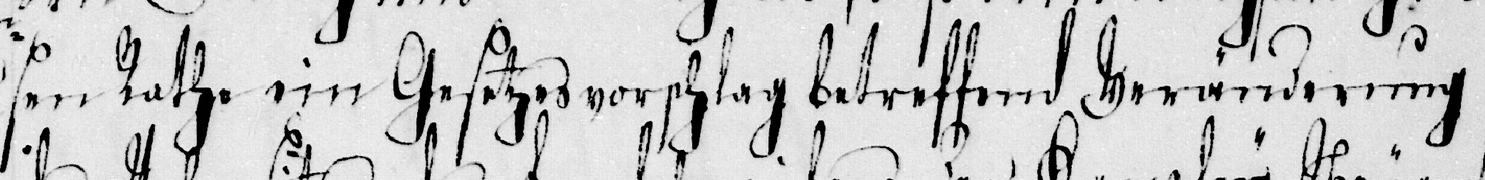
en Rathe ein Gesetzesvorschlag betreffend Veränderung
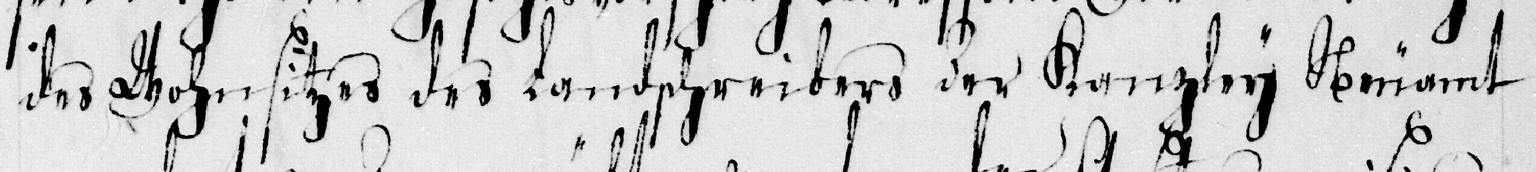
des Wohnsitzes des Landschreibers der Kanzley Neuamt
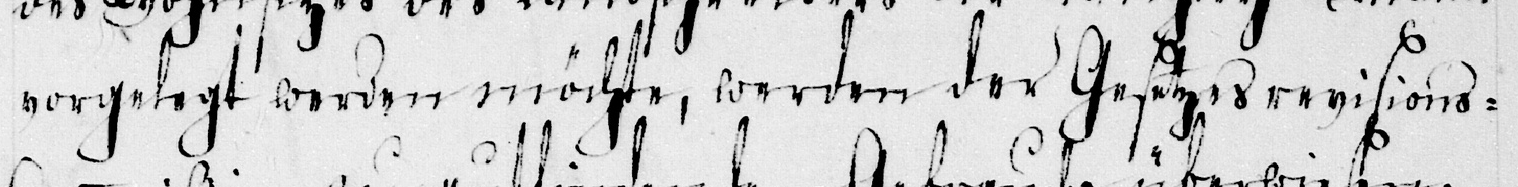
vorgelegt werden möchte, werden der Gesetzesrevision¬
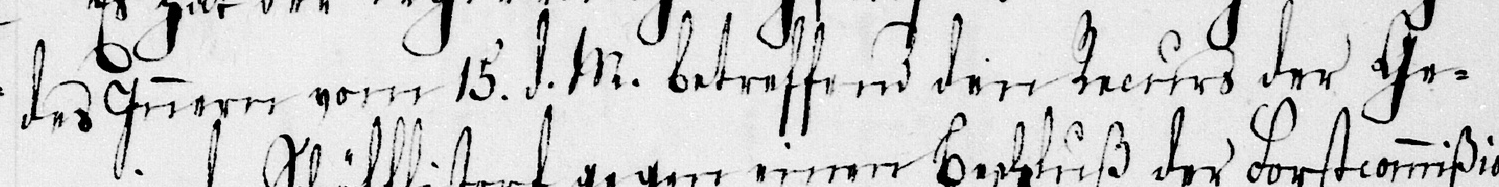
des Innern vom 15. d. M. betreffend den Recurs der Ge¬
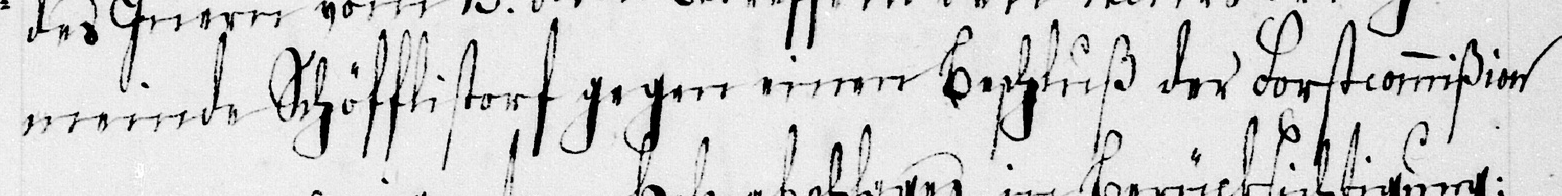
meinde Schöfflistorf gegen einen Beschluß der Forstcommißion
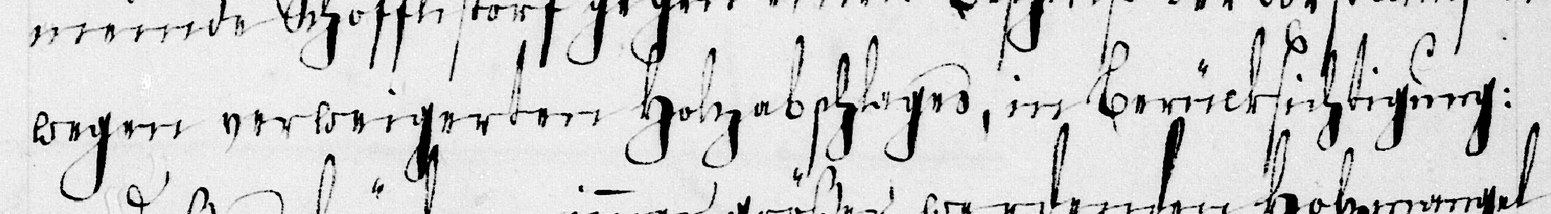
wegen verweigerten Holzabschlages, in Berücksichtigung:
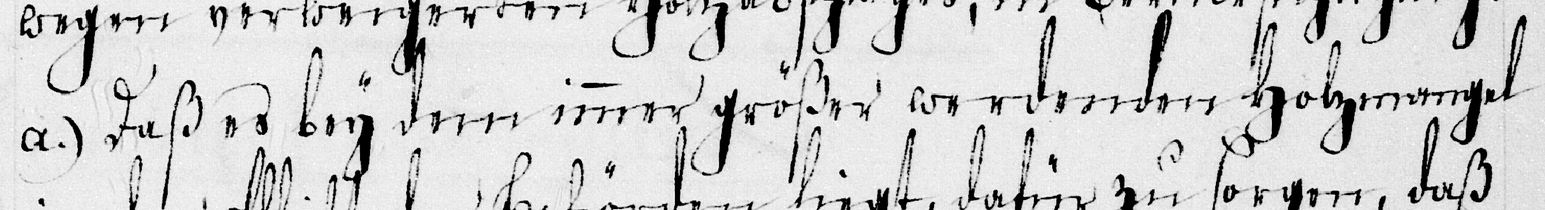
a.) Daß es bey dem immer größer werdenden Holzmangel
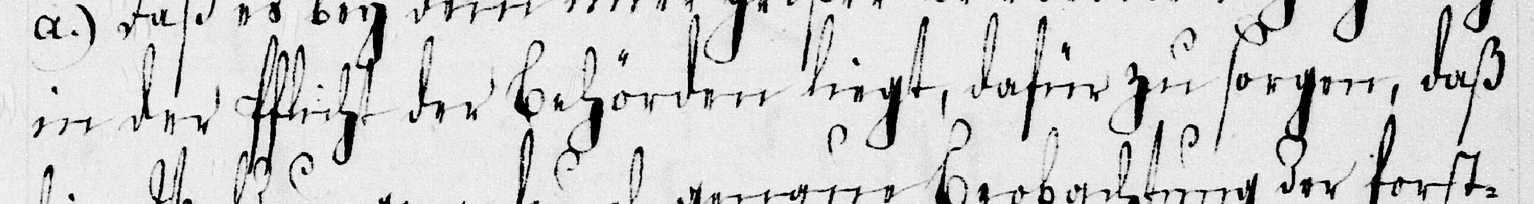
in der Pflicht der Behörden liegt, dafür zu sorgen, daß
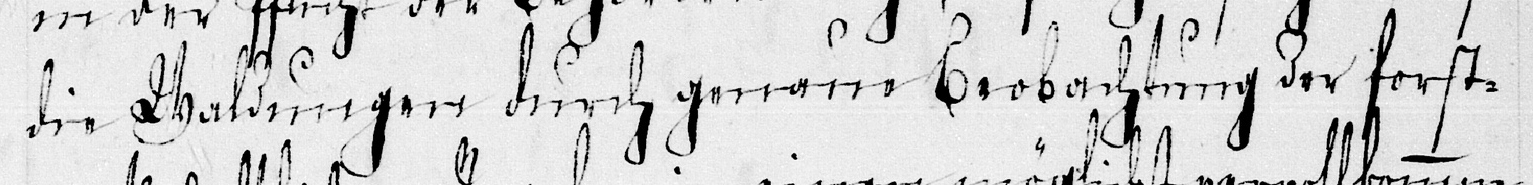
die Waldungen durch genaue Beobachtung der forst¬
